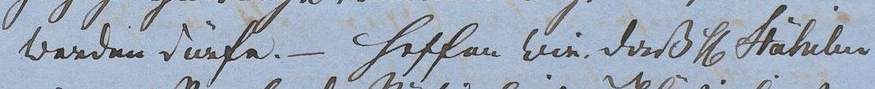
werden dürfe. – Hoffen wir, daß H. Stähelin
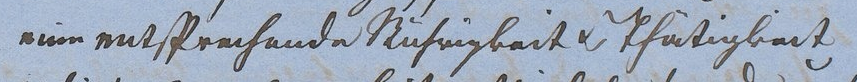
eine entsprechende Rührigkeit & Thätigkeit
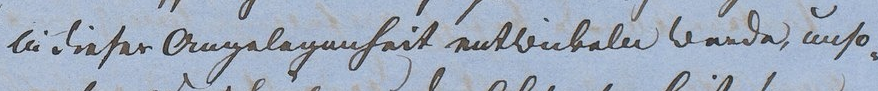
bei dieser Angelegenheit entwickeln werde, umso-
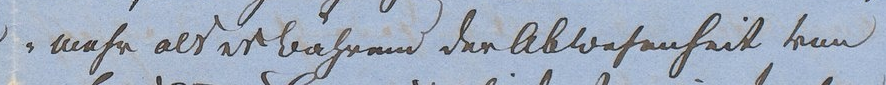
mehr als er während der Abwesenheit von
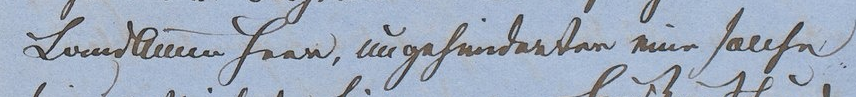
LandAmmann Heer, ungehinderter eine solche
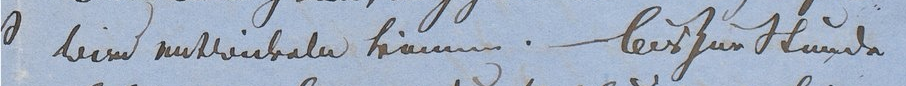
wird entwickeln können. – Bis zur Stunde
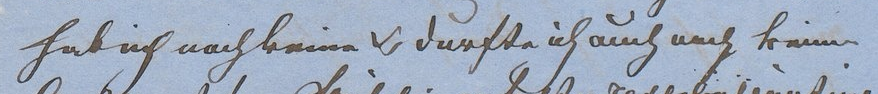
habe ich noch keine & durfte ich auch noch keine
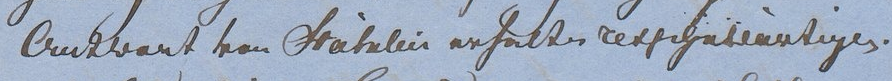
Antwort von Stähelin erhalten resp. gewärtigen.
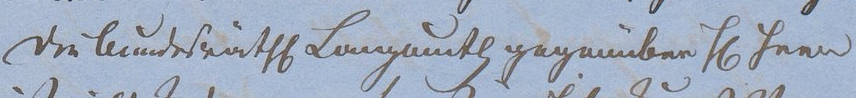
Die bundesräthliche Langmuth gegenüber H. Heer
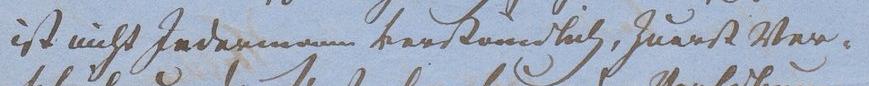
ist nicht Jedermann verständlich, zuerst Ver-
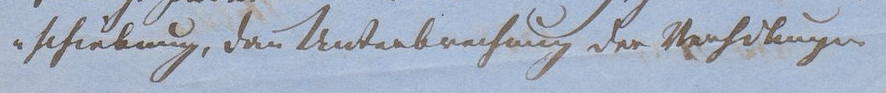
schiebung, dann Unterbrechung der Verhandlungen,
